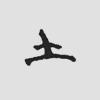土
